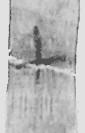七
